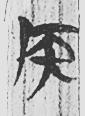侯
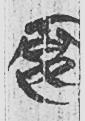妻
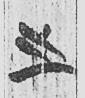之
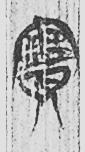賽
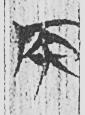侯
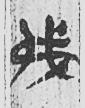弗
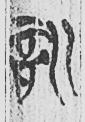訓
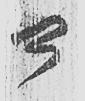乃
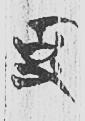史
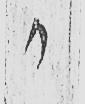人
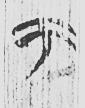于
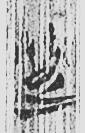楚
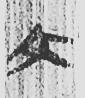文
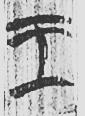王
